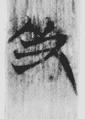及
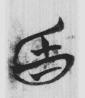昏
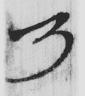乃
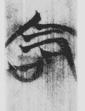命
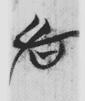左
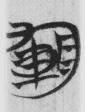軍
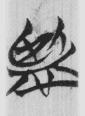監
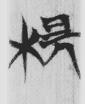{木𡵂}
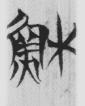{魚木}
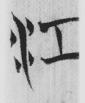江
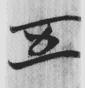五
